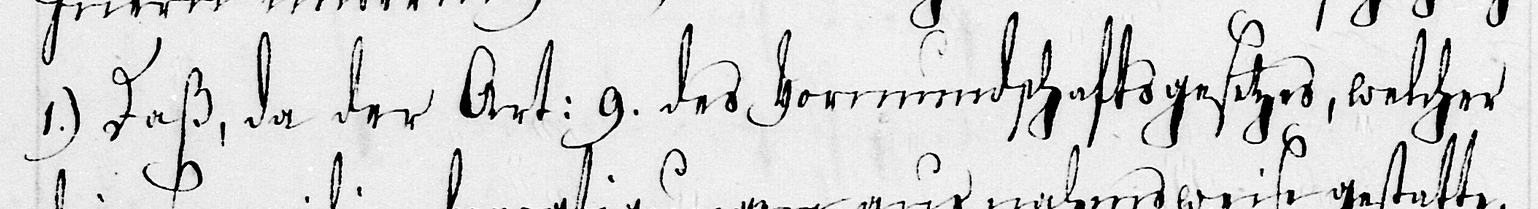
1.) Daß, da der Art. 9. des Vormundschaftsgesetzes, welcher
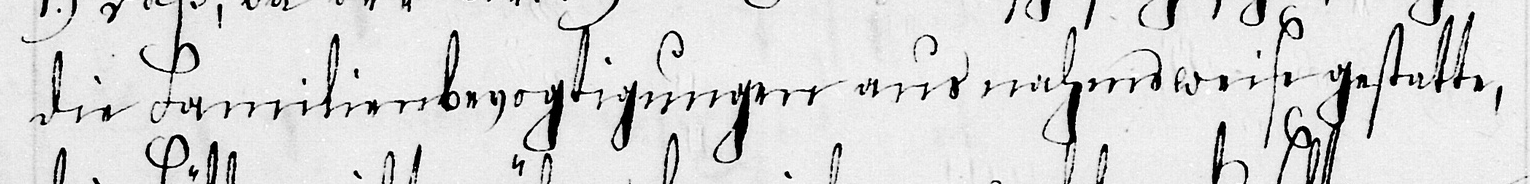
die Familienbevogtigungen ausnahmsweise gestatte,
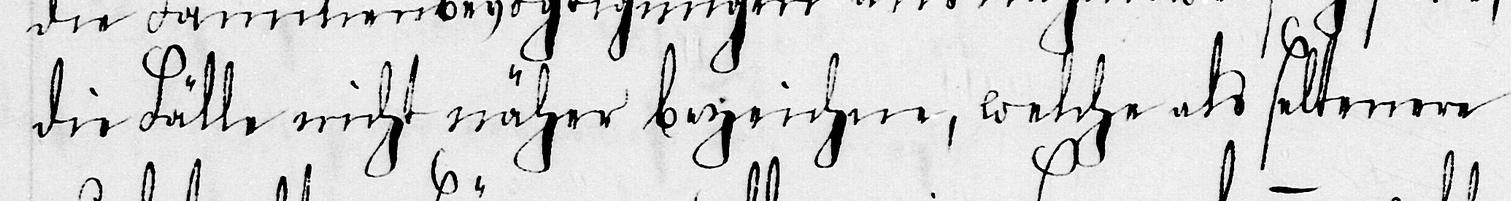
die Fälle nicht näher bezeichne, welche als seltenere
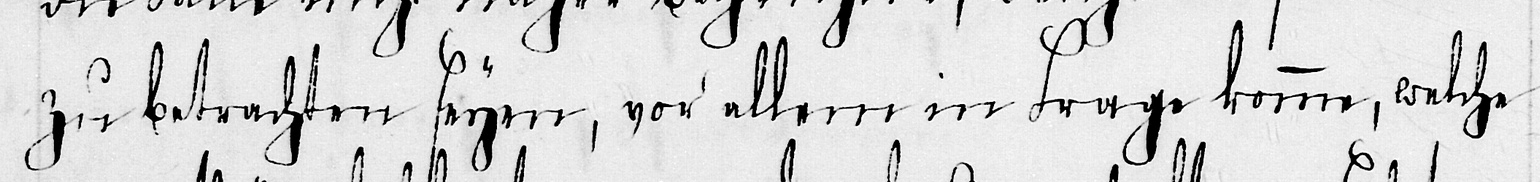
zu betrachten seyen, vor allem in Frage komme, welche
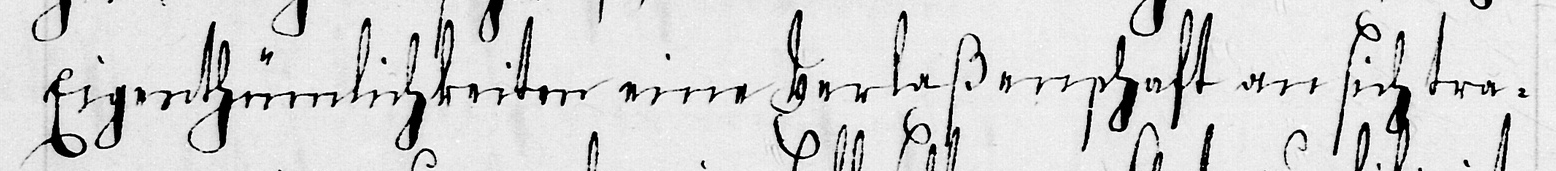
Eigenthümlichkeiten eine Verlaßenschaft an sich tra¬
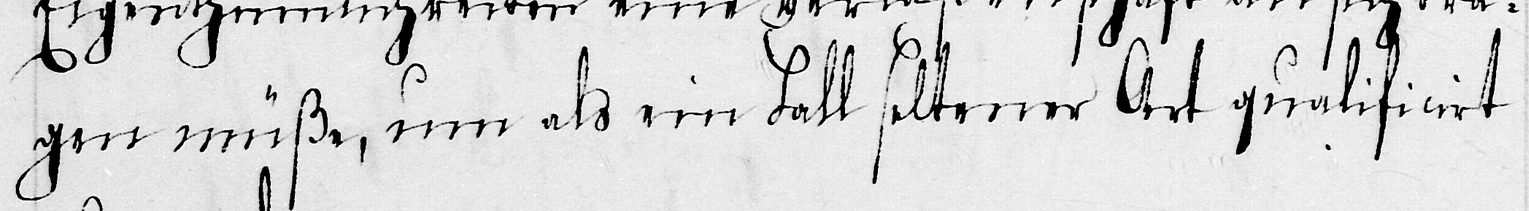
gen müße, um als ein Fall seltener Art qualificirt
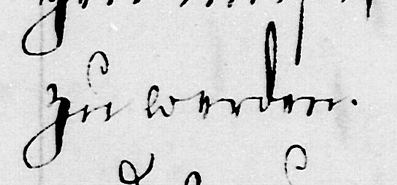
zu werden.
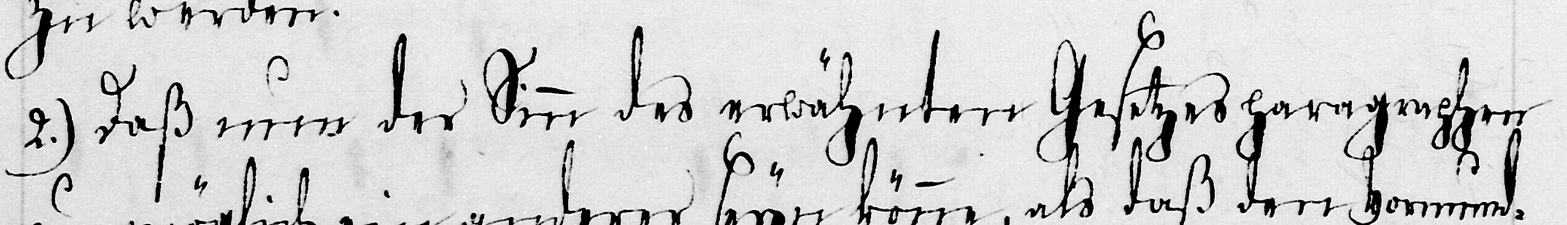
2.) Daß nun der Sinn des erwähnten Gesetzesparagraphen
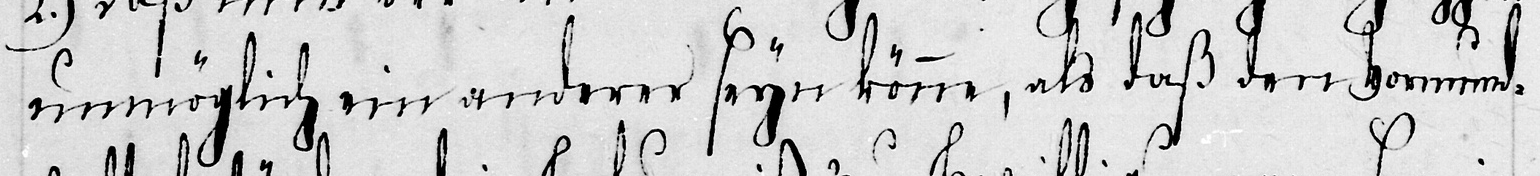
unmöglich ein anderer seyn könne, als daß den Vormund¬
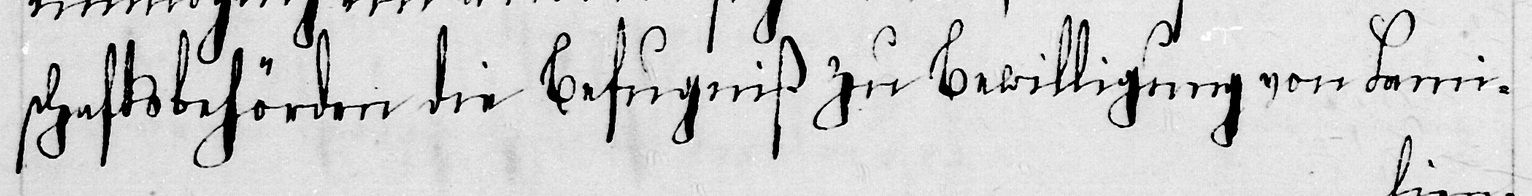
schaftsbehörden die Befugniß zu Bewilligung von Fami-
